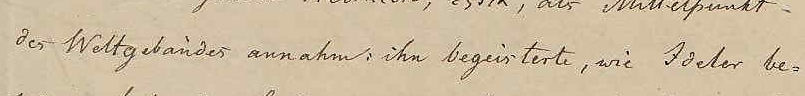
des Weltgebäudes annahm: ihn begeisterte, wie Ideler be-
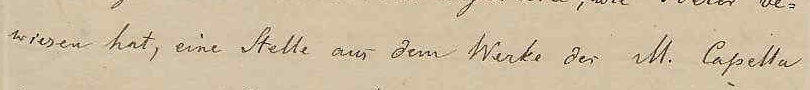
wiesen hat, eine Stelle aus dem Werke des M. Capella
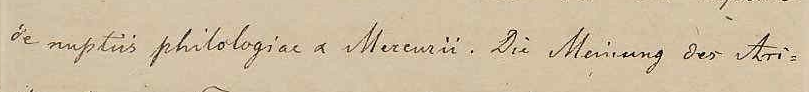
de nuptiis philologiae & Mercurii. Die Meinung des Ari-
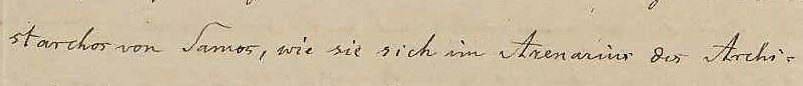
starchos von Samos, wie sie sich im Arenarius des Archi-
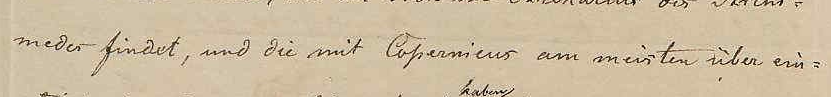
medes findet, und die mit Copernicus am meisten über ein-
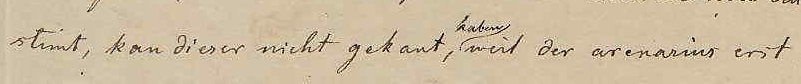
stimt, kan dieser nicht gekant haben, weil der arenarius erst
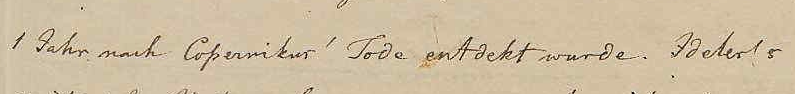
1 Jahr nach Copernikus' Tode entdekt wurde. Ideler's
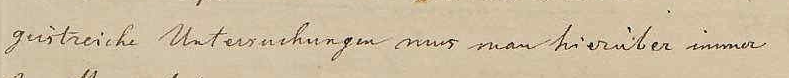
geistreiche Untersuchungen mus man hierüber immer
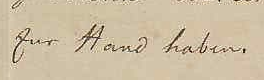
zur Hand haben.
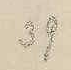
dar.
